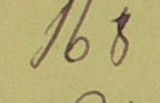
168
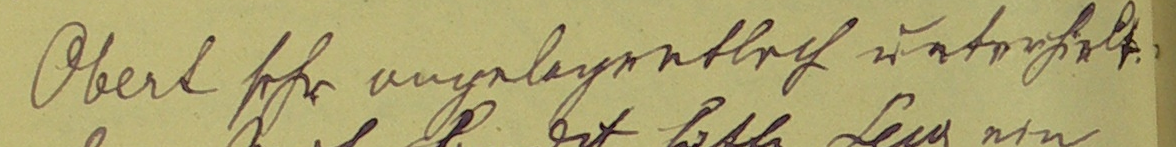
Obert sehr angelegentlich unterhielt.
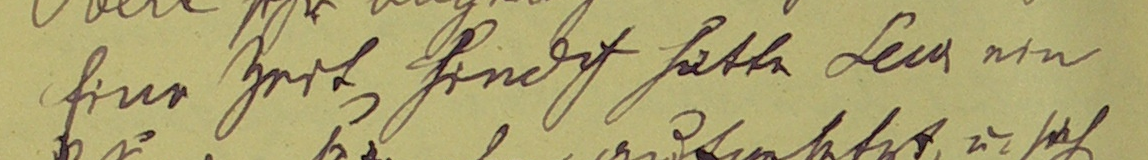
Eine Zeit hindurch hätte Lew. ein
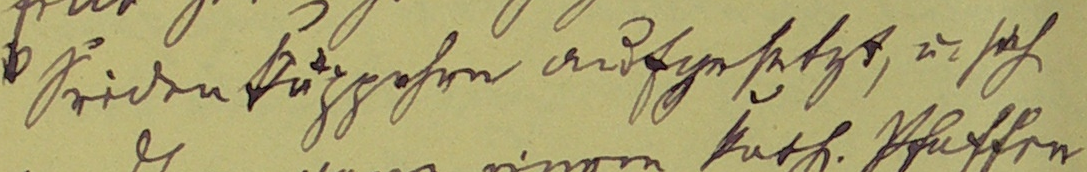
Seidenkäppchen aufgesetzt, und sah
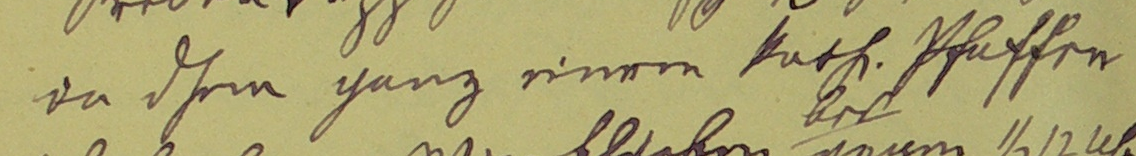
in diesem ganz einem kath. Pfaffen
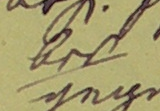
bis
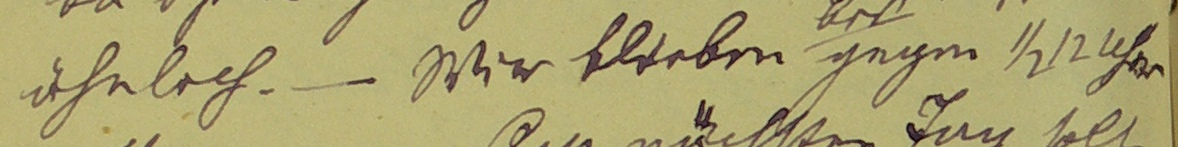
ähnlich.-Wir blieben gegen ½ 2 Uhr
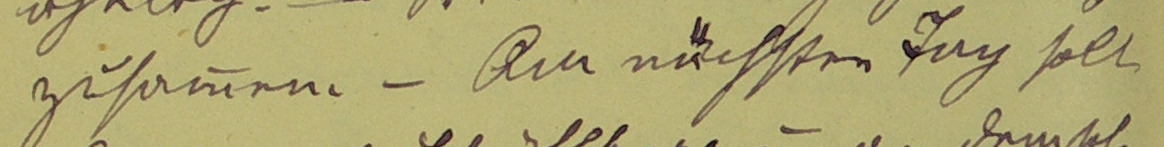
zusammen.—Am nächsten Tag soll
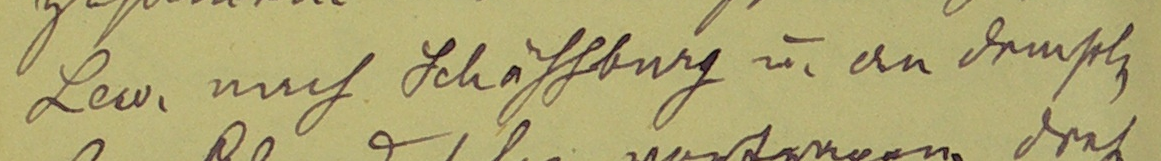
Lew. Nach Schäßburg und an demsel¬
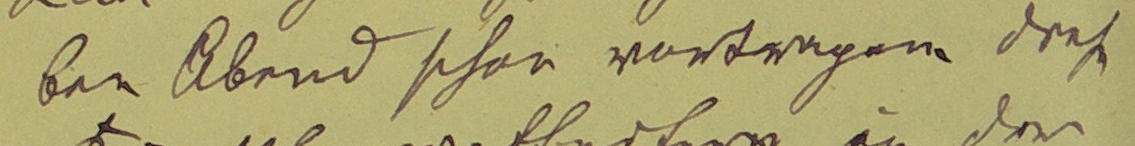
ben Abend schon vortragen. Diese
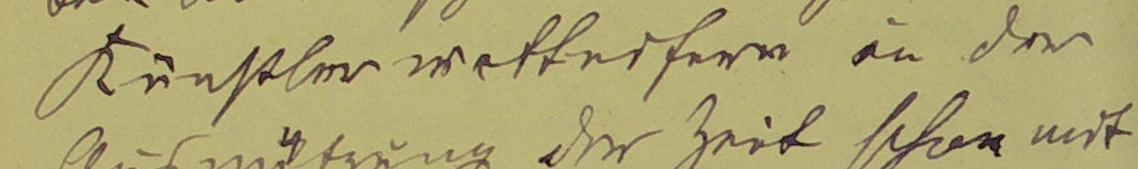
Künstler wetteifern an der
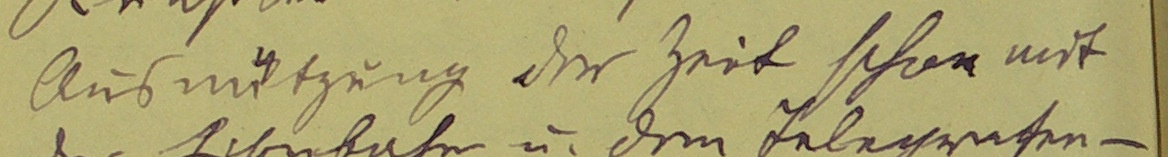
Ausnützung der Zeit schon mit
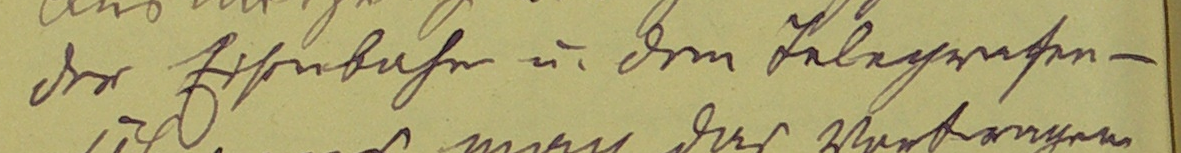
der Eisenbahn und dem Telegrafen.—
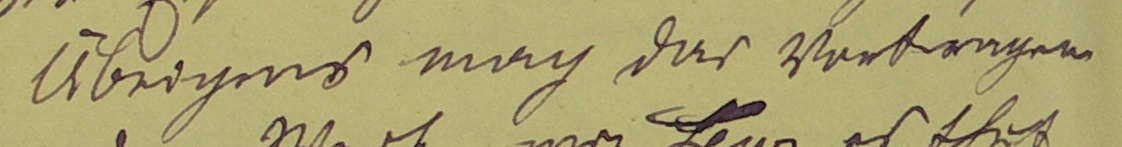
Übrigens mag das Vortragen
